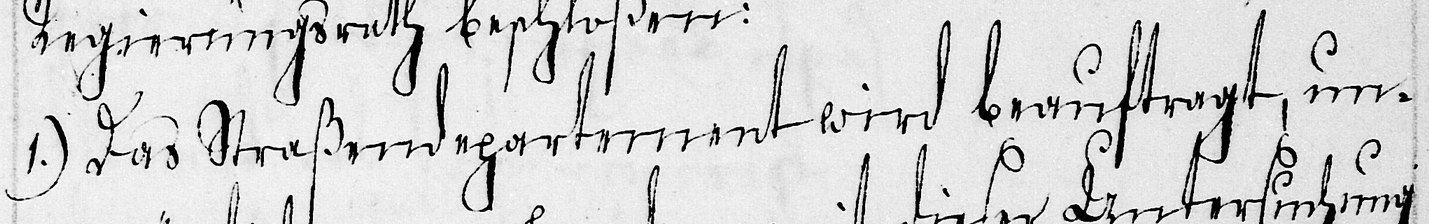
1.) Das Straßendepartement wird beauftragt, un¬
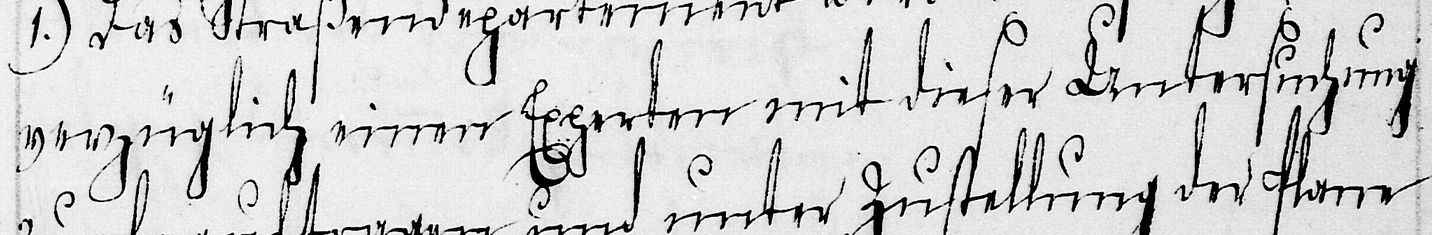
verzüglich einen Experten mit dieser Untersuchung
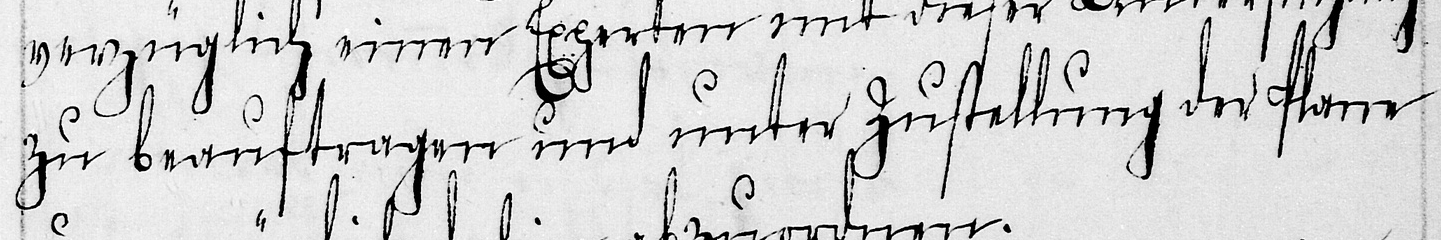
zu beauftragen und unter Zustellung der Plane
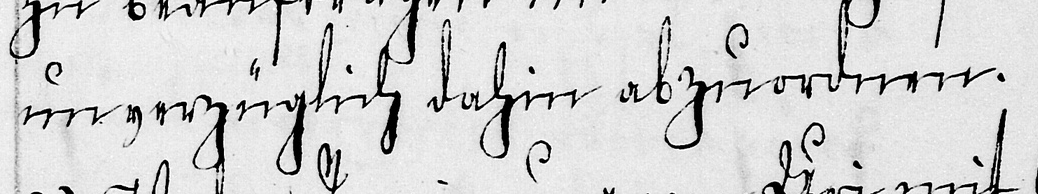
unverzüglich dahin abzuordnen.
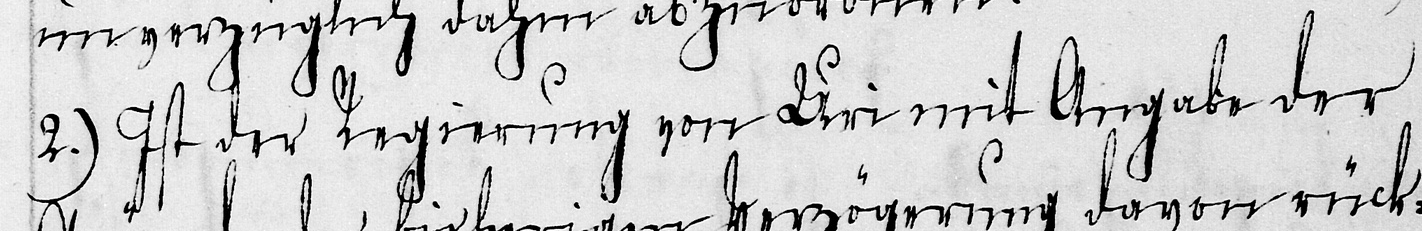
2.) Ist der Regierung von Uri mit Angabe der
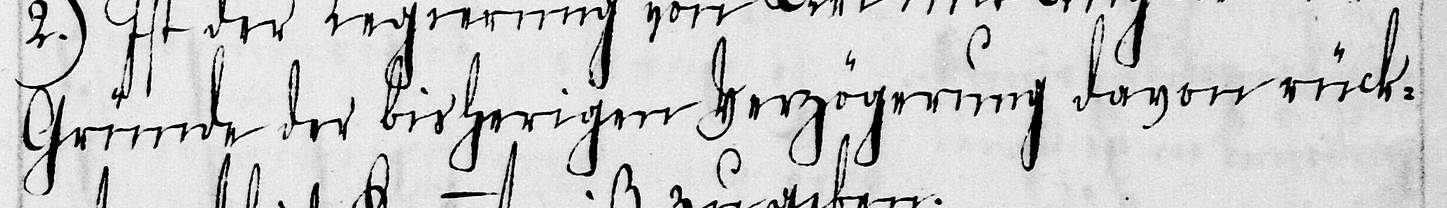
Gründe der bisherigen Verzögerung davon rück¬
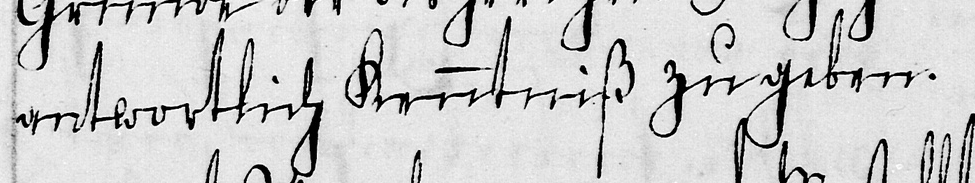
antwortlich Kenntniß zu geben.
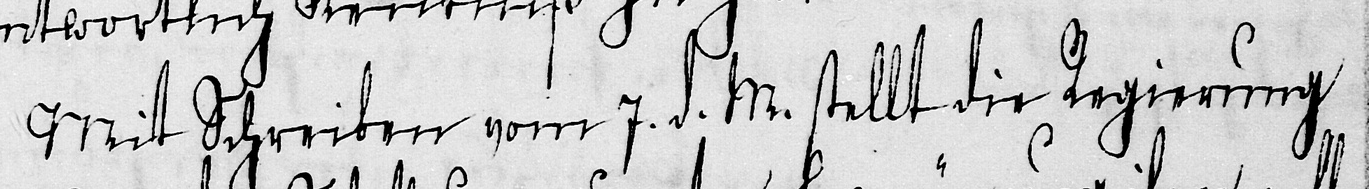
Mit Schreiben vom 7. d. M. stellt die Regierung
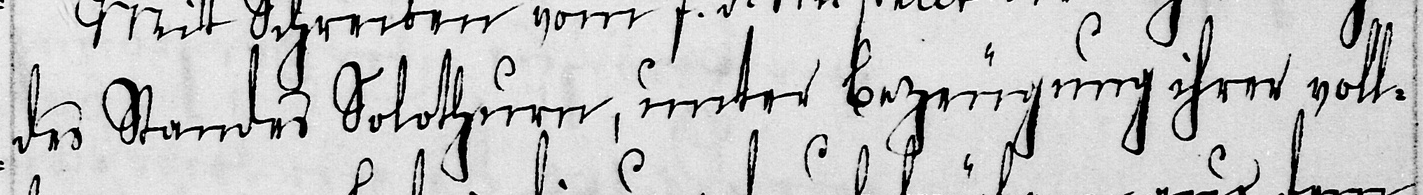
des Standes Solothurn, unter Bezeugung ihrer voll¬
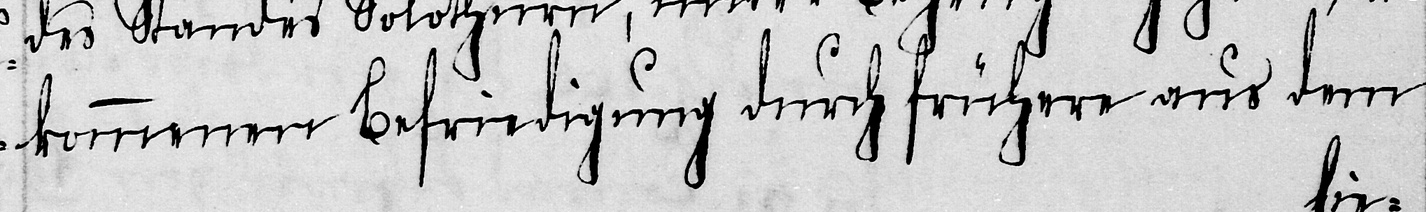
kommenen Befriedigung durch frühere aus dem
